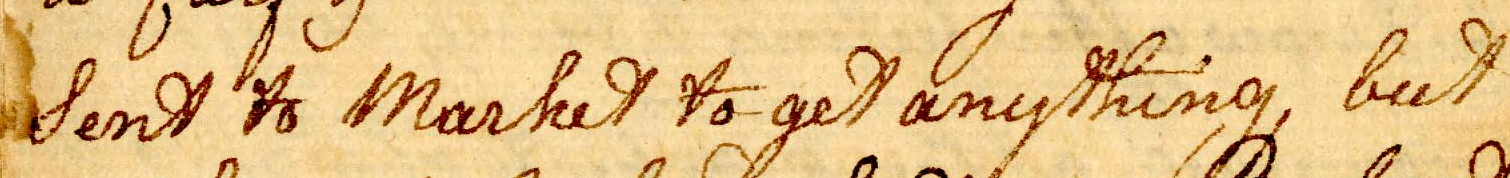Sent to Market to get anything, but
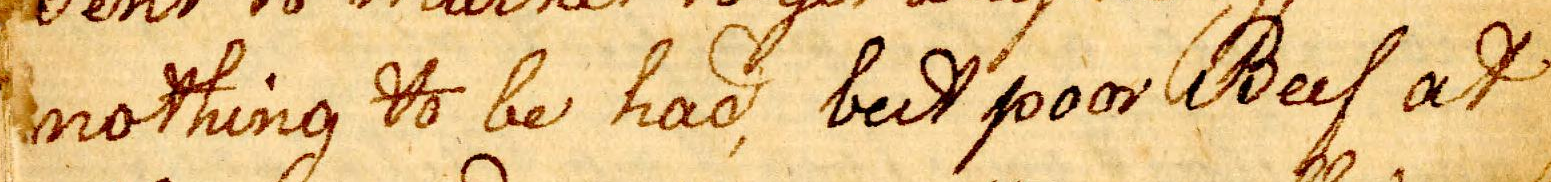nothing to be had but poor Beef at
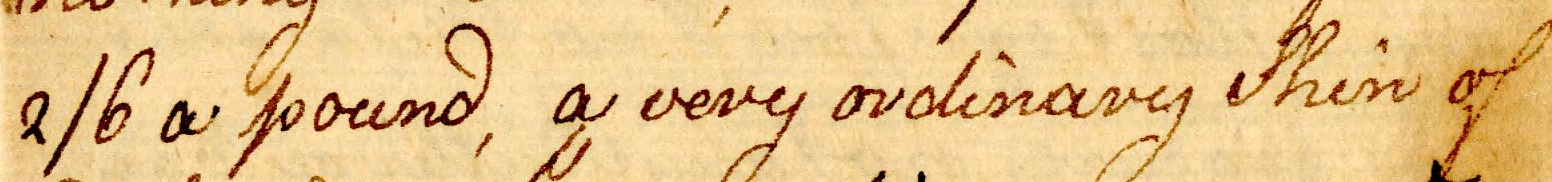2s6 a pound, a very ordinary Shin of
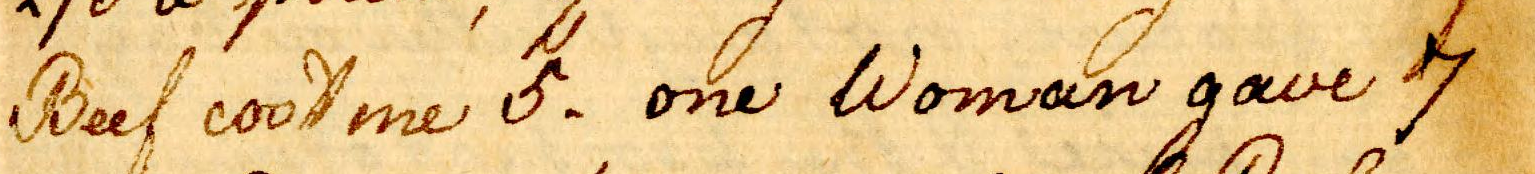Beef cost me 5. one Woman gave 7
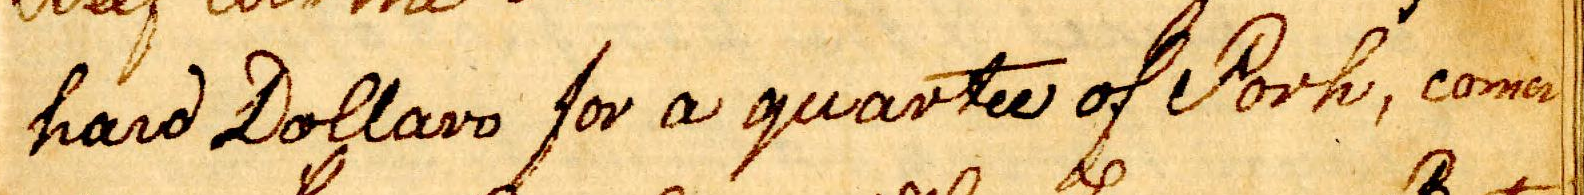hard Dollars for a quarter of Pork, comon
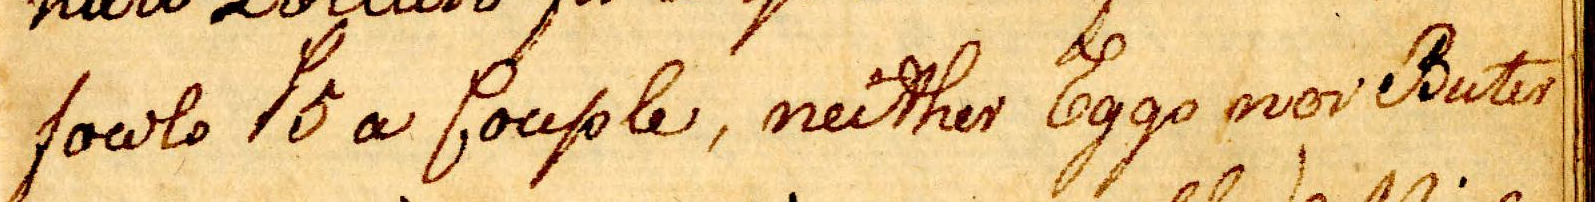fowls 15 a Couple, neither Eggs nor Buter
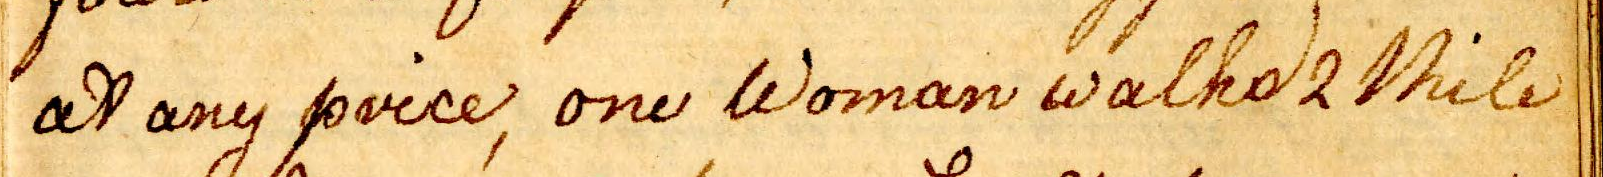at any price, one Woman walkd 2 Mile
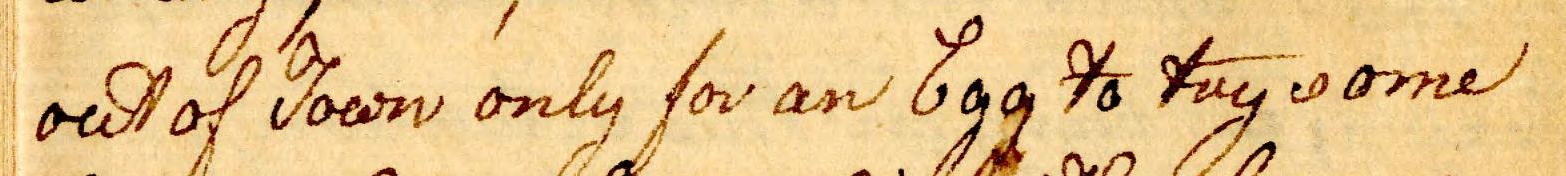out of Town only for an Egg to try some
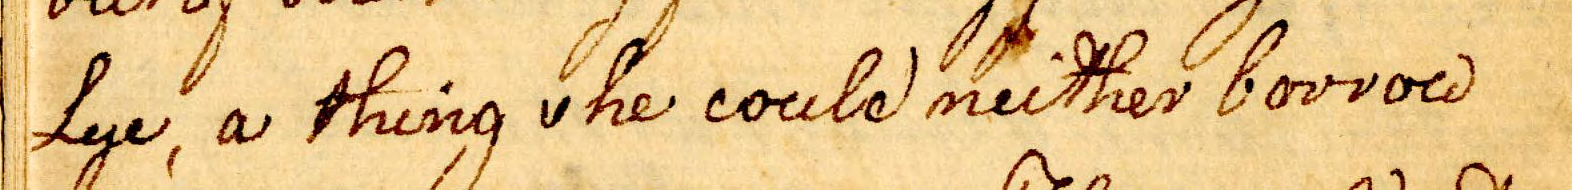Lye, a thing she could neither borrow
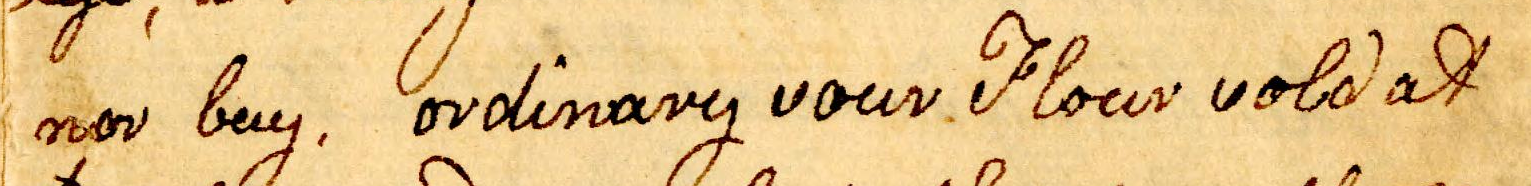nor buy, ordinary sour Flour sold at
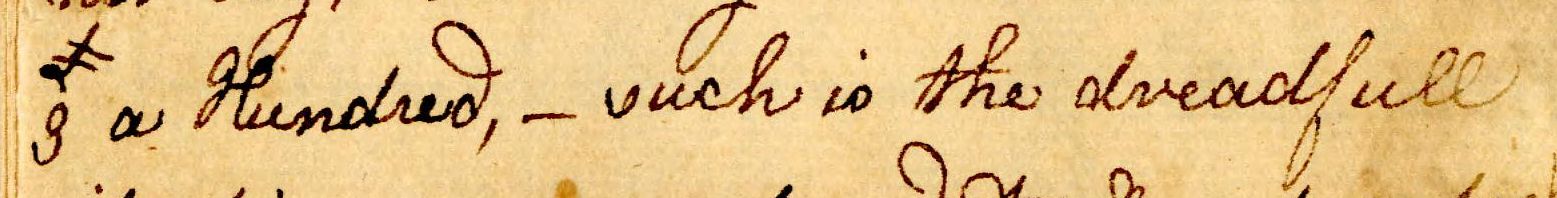3^£ a Hundred,- such is the dreadfull
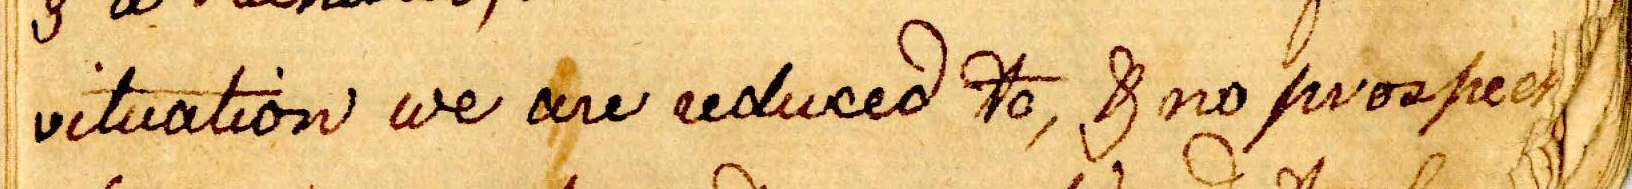situation we are reduced to, & no prospect
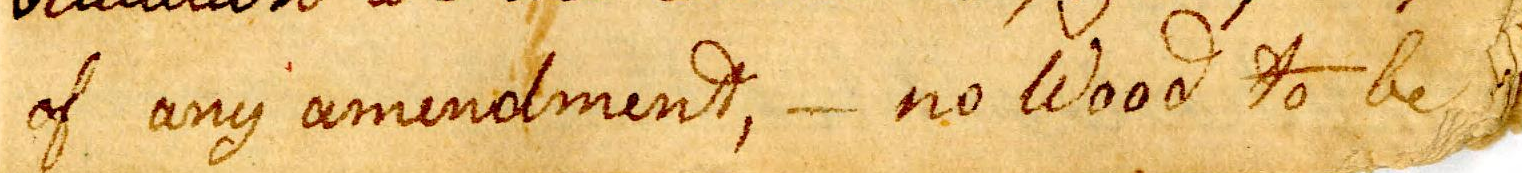of any amendment,- no Wood to be
